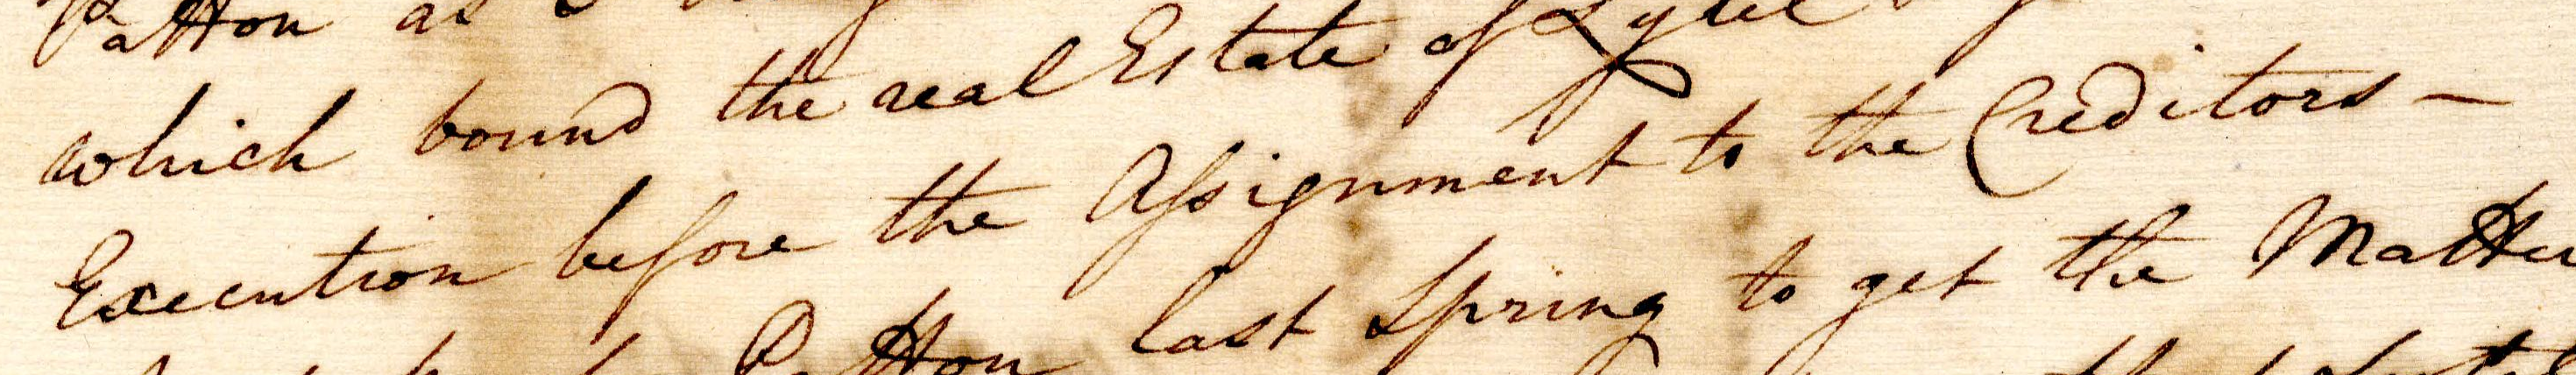Execution before the Assignment to the Creditors-
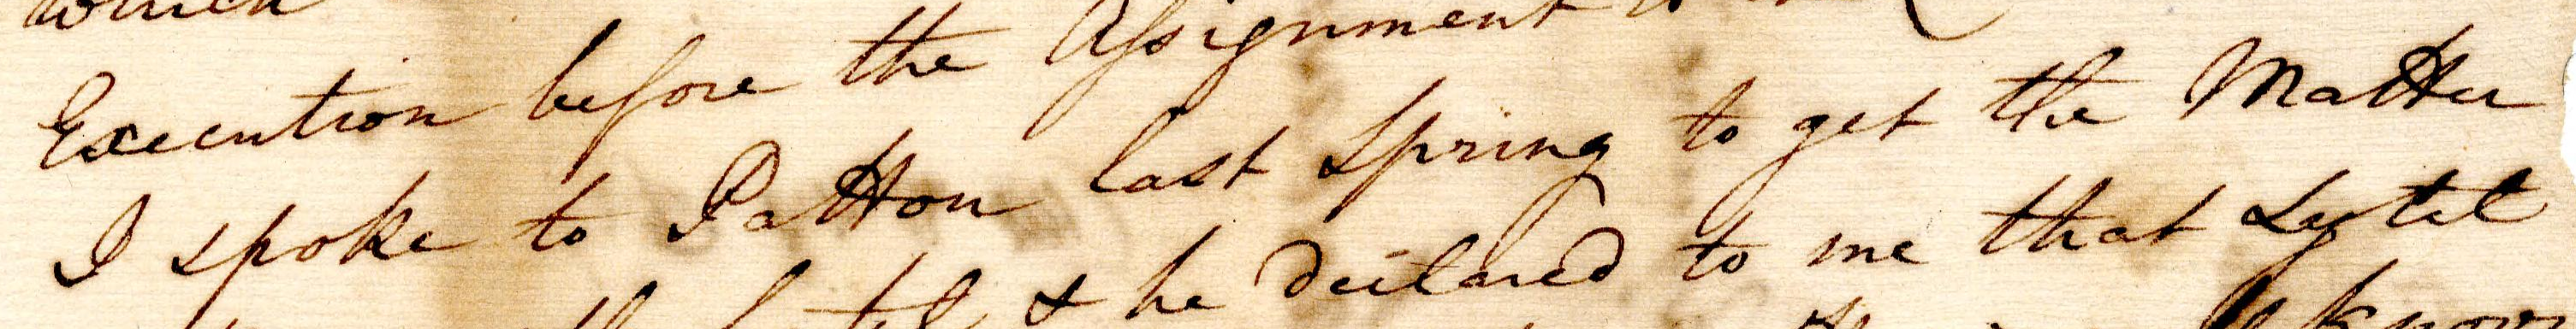I spoke to Patton last Spring to get the Matter
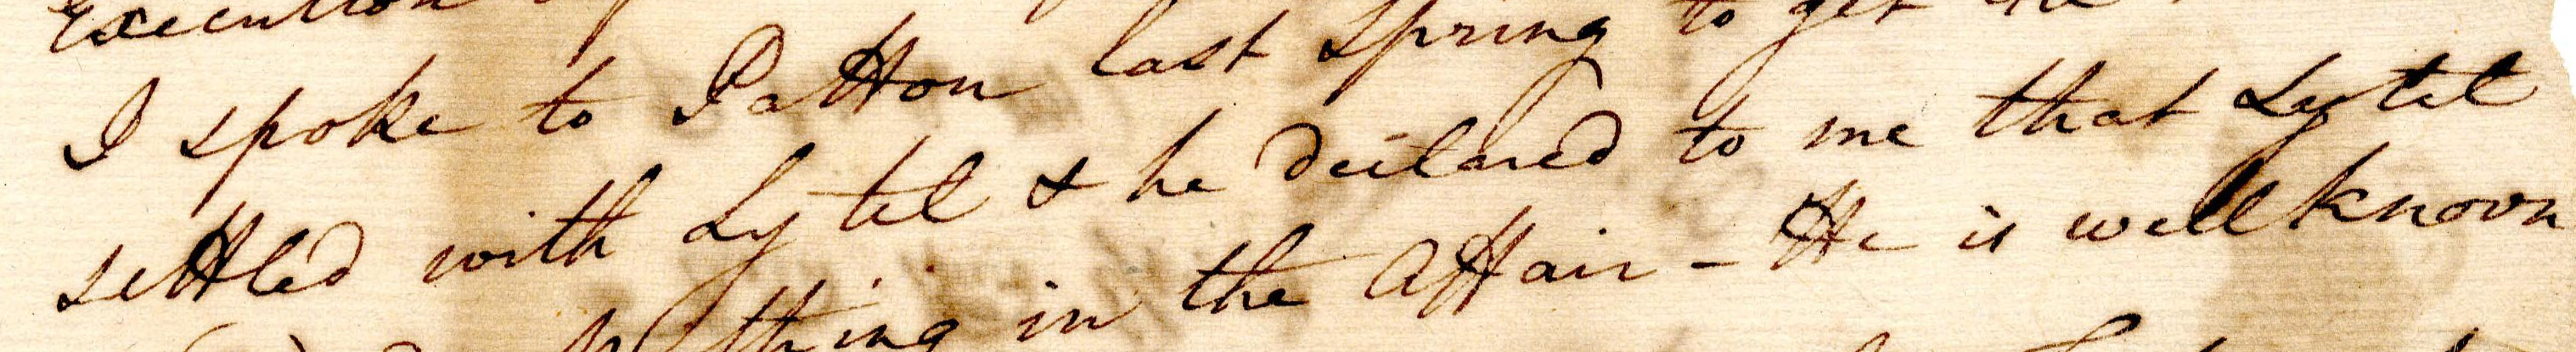settled with Lytel & he declared to me that Lytel
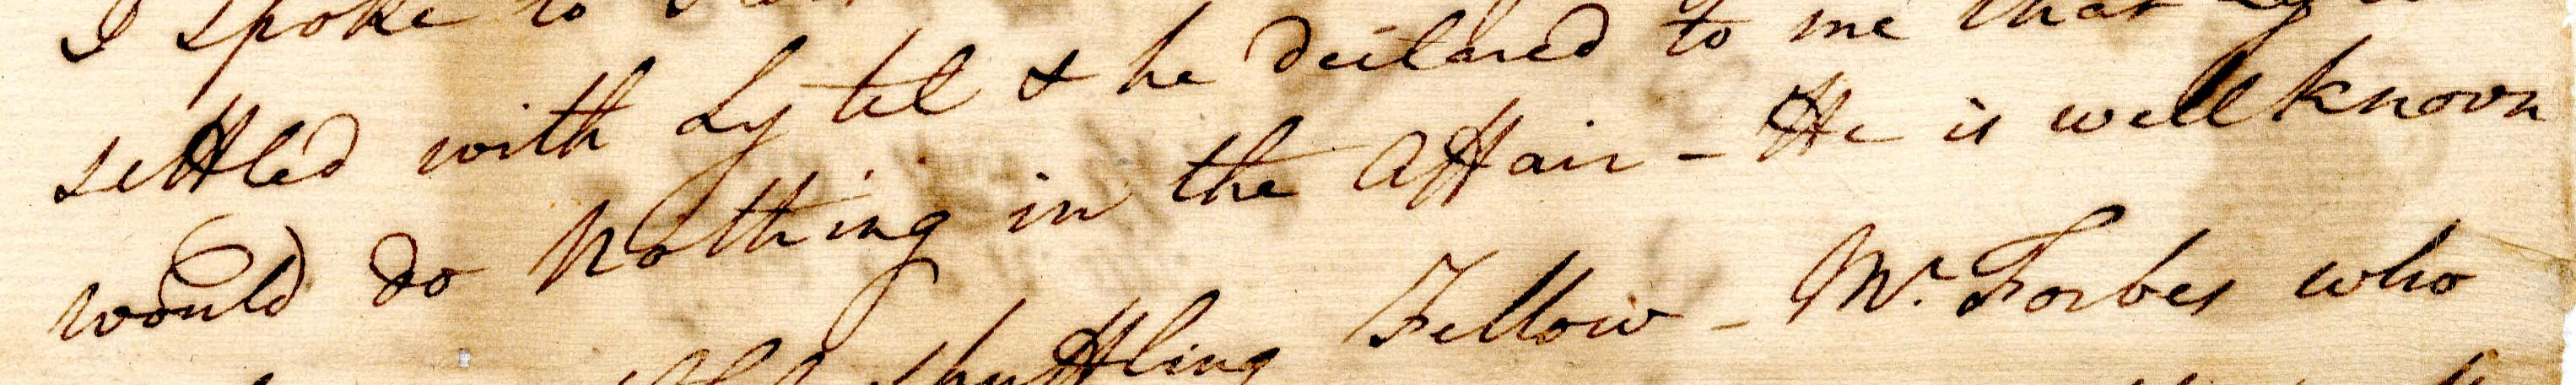would do Nothing in the Affair- He is well known
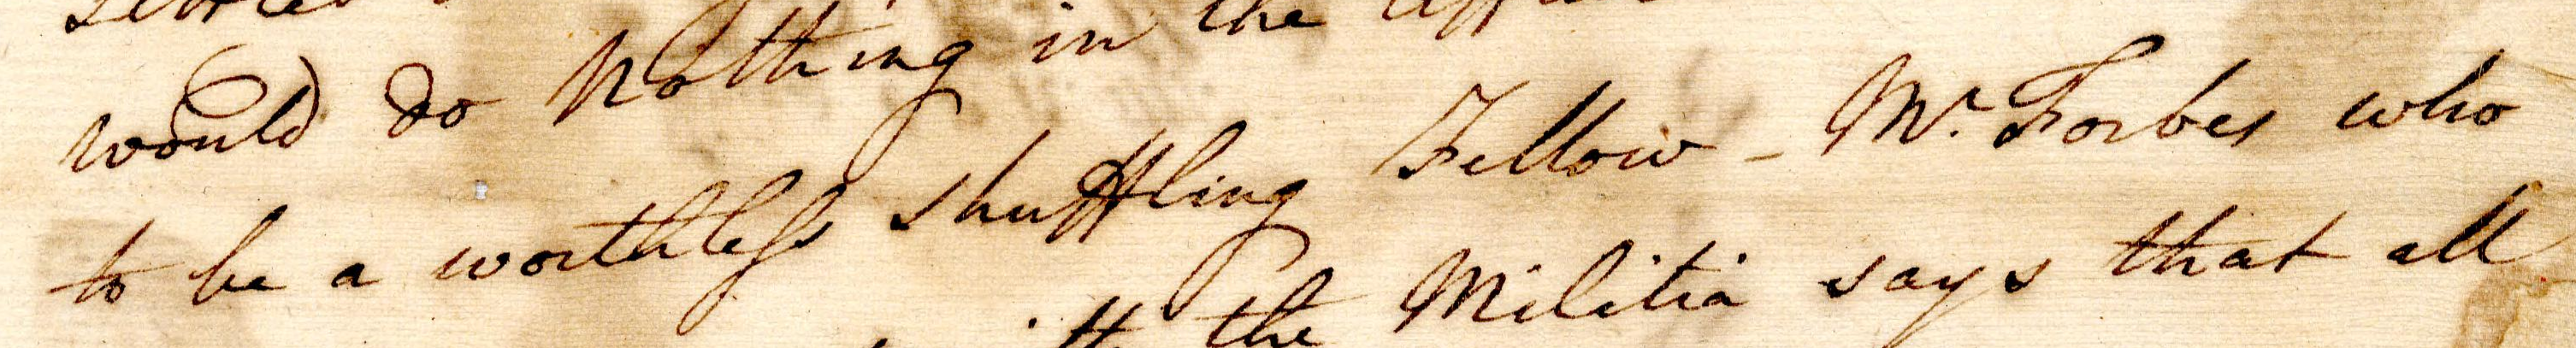to be a worthless shuffling Fellow- M^r. Forbes who
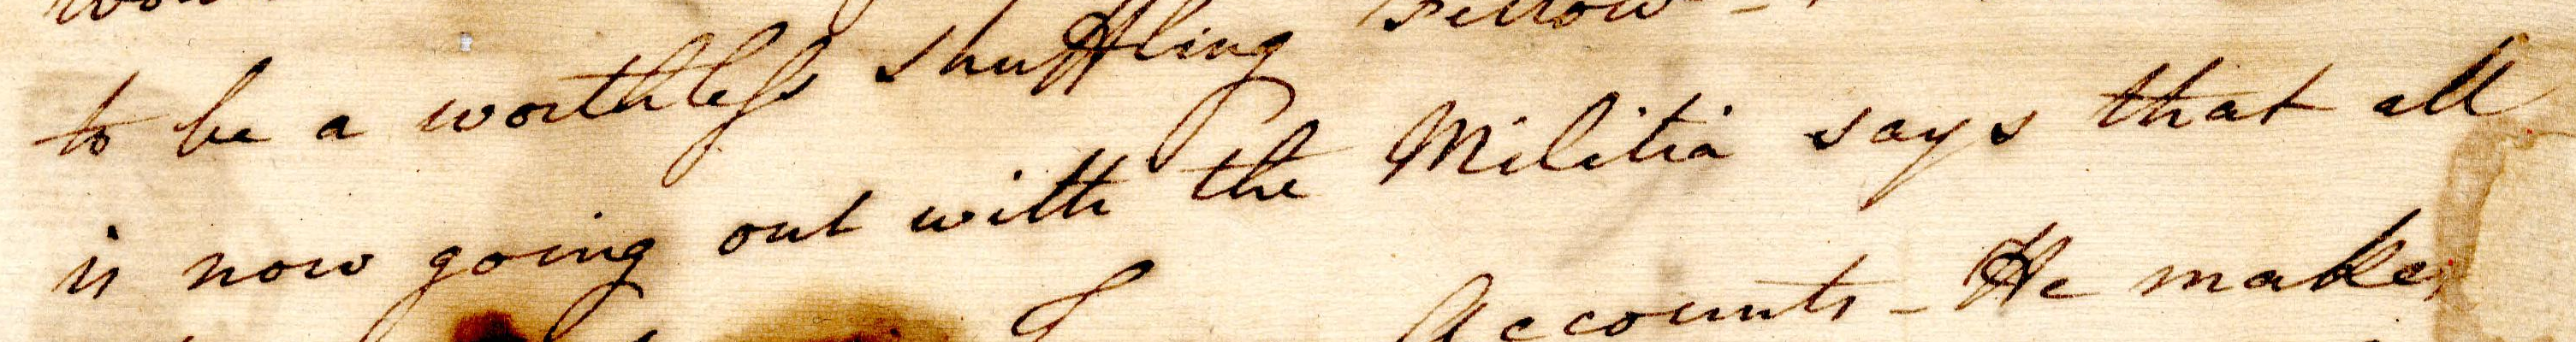is now going out with the Militia says that all
